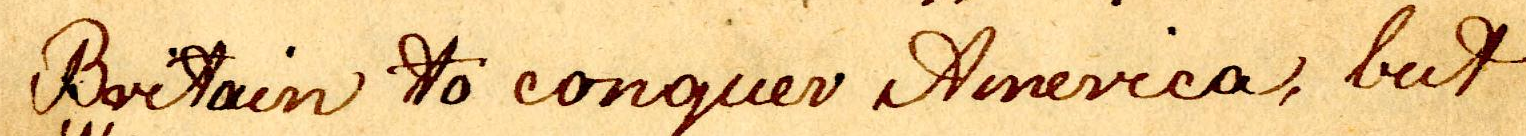Britain to conquer America, but
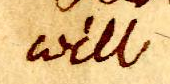will
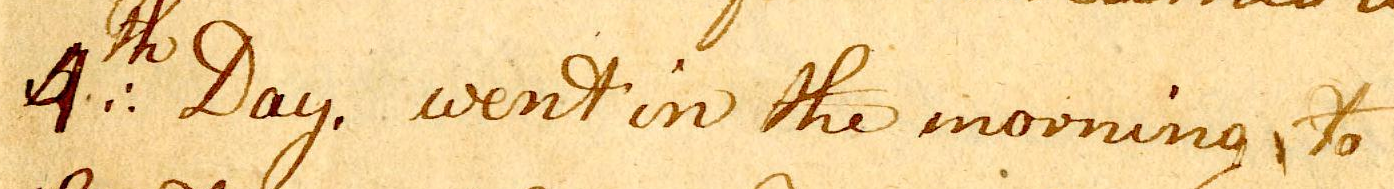4^th: Day. went in the morning to
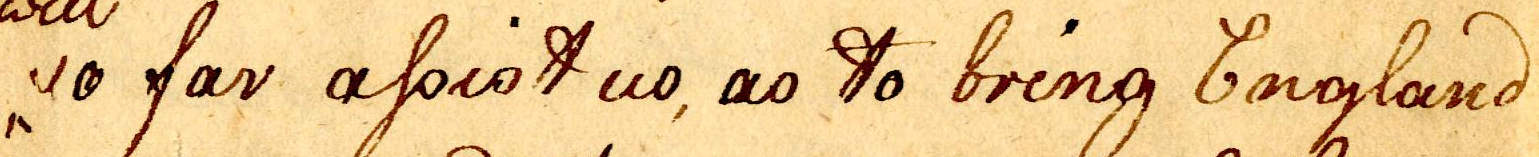^ so far assist us, as to bring England
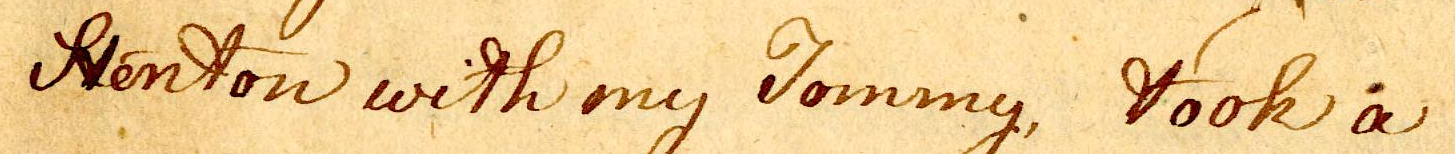Stenton with my Tommy, took a
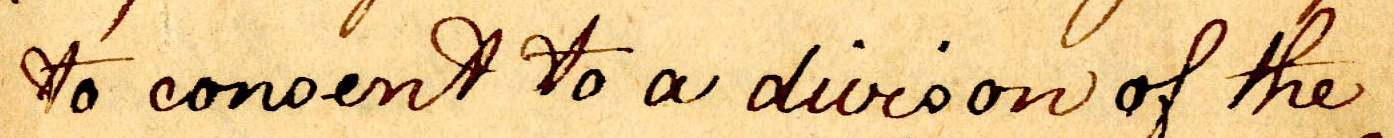to consent to a division of the
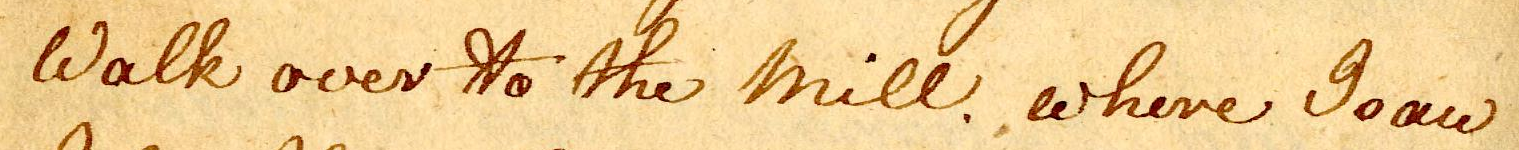Walk over to the Mill, where Joan
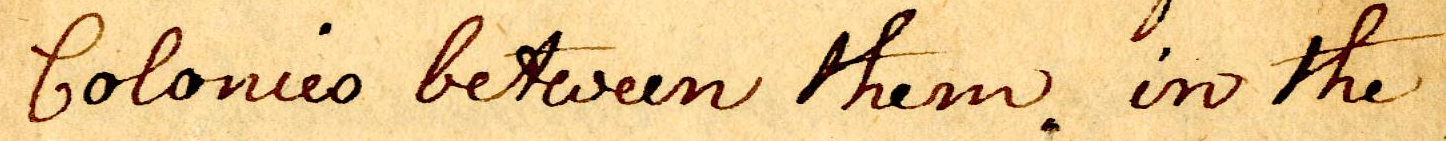Colonies between them. in the
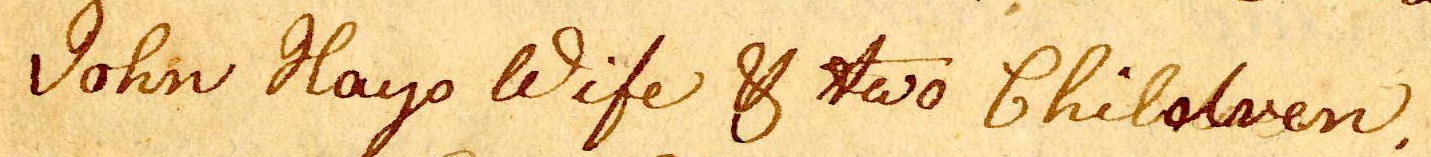John Hays Wife & two Children,
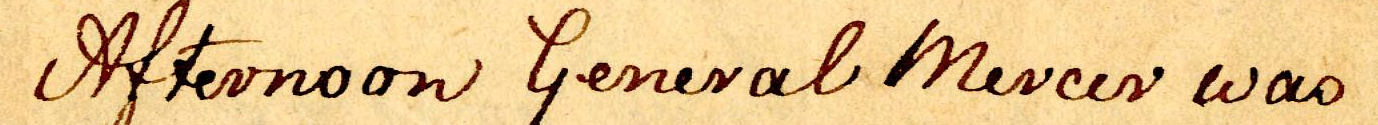Afternoon General Mercer was
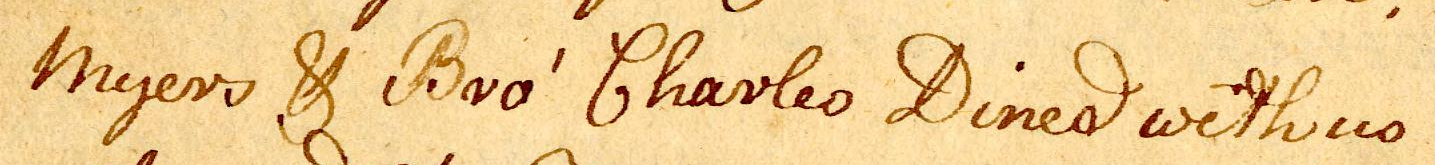Myers & Bro' Charles Dines with us
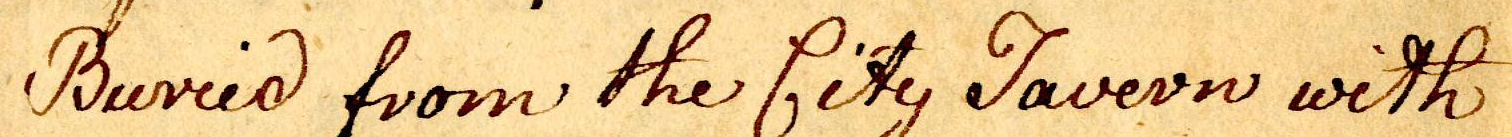Buried from the City Tavern with
